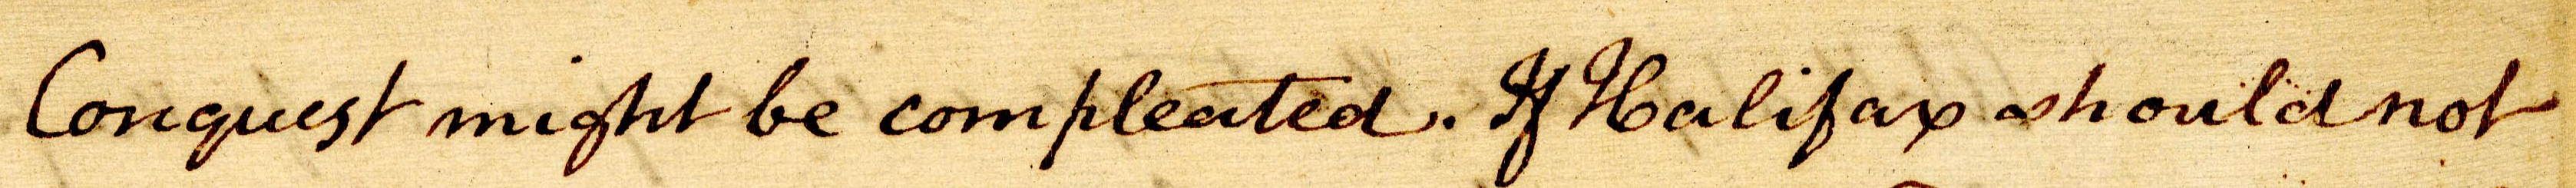Conquest might be compleated. If Halifax should not
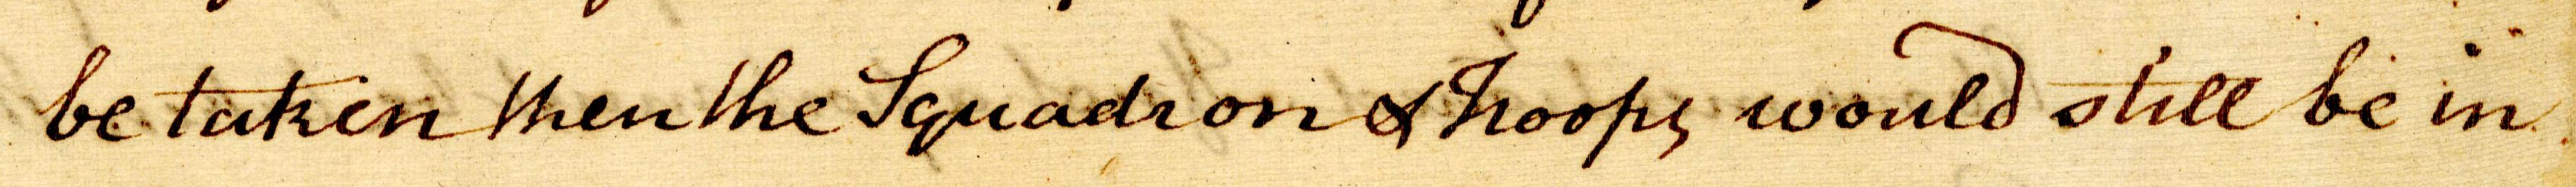be taken then the Squadron & Troops would still be in
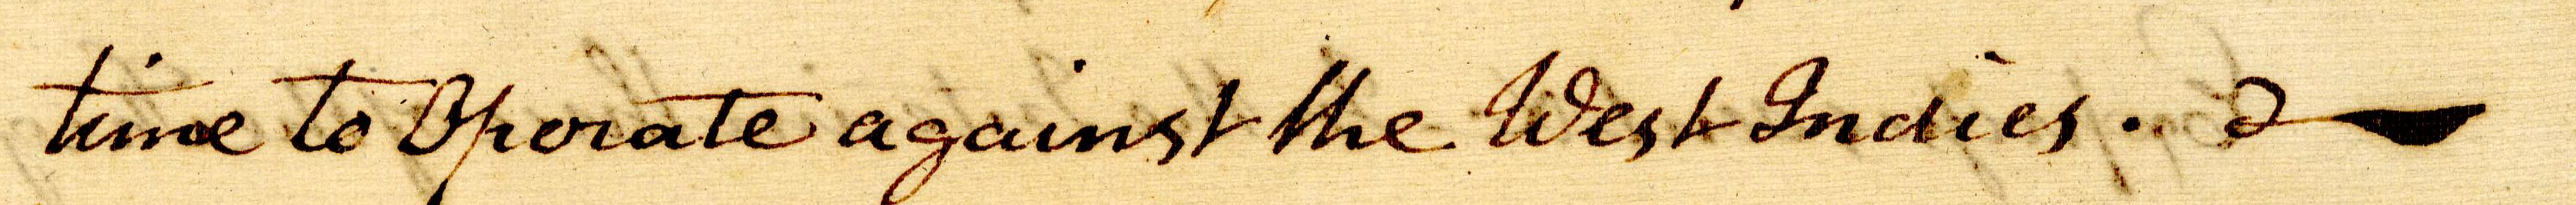time to Operate against the West Indies.-
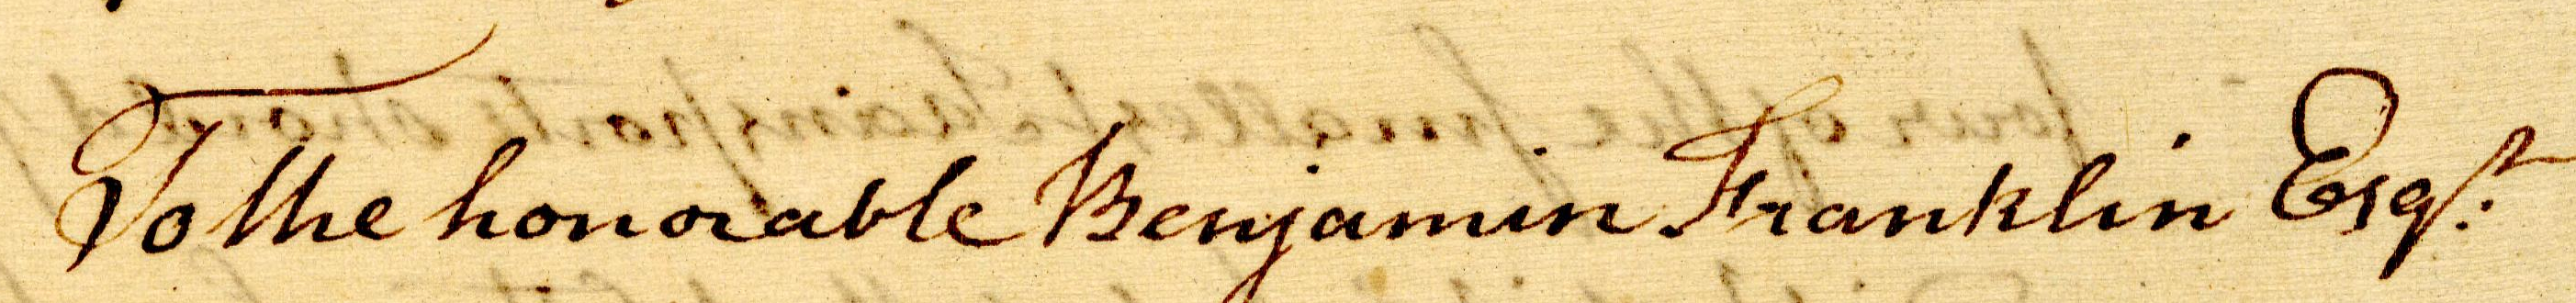To the honorable Benjamin Franklin Esq^r:
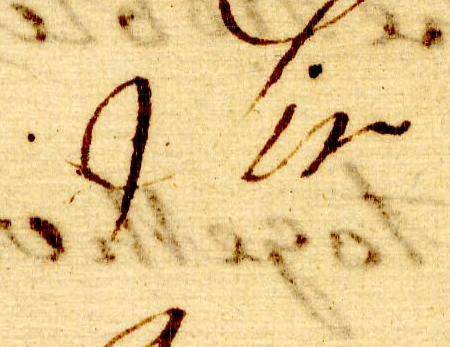Sir
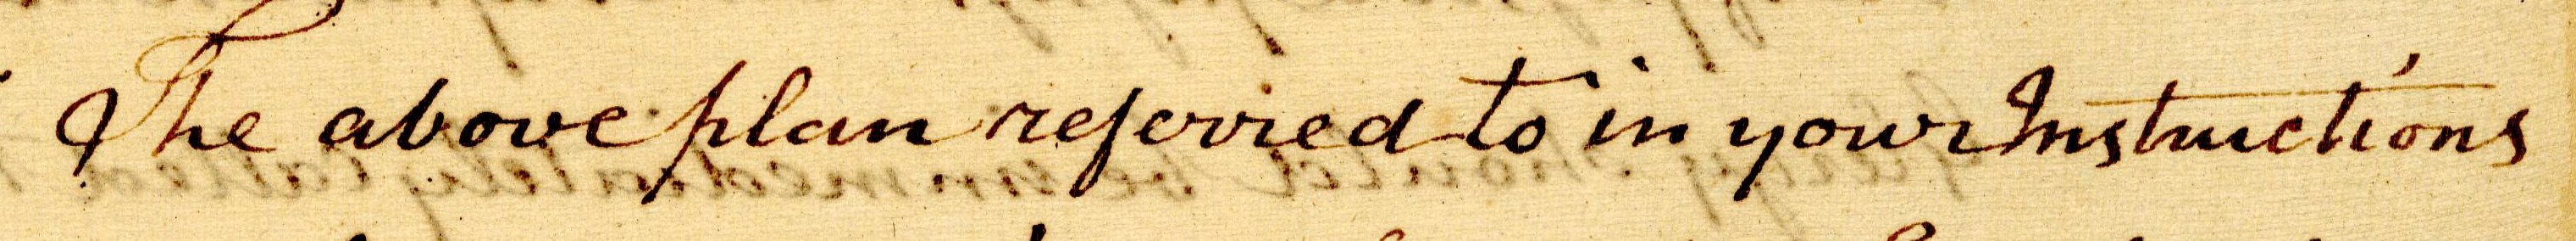The above plan referred to in your Instructions
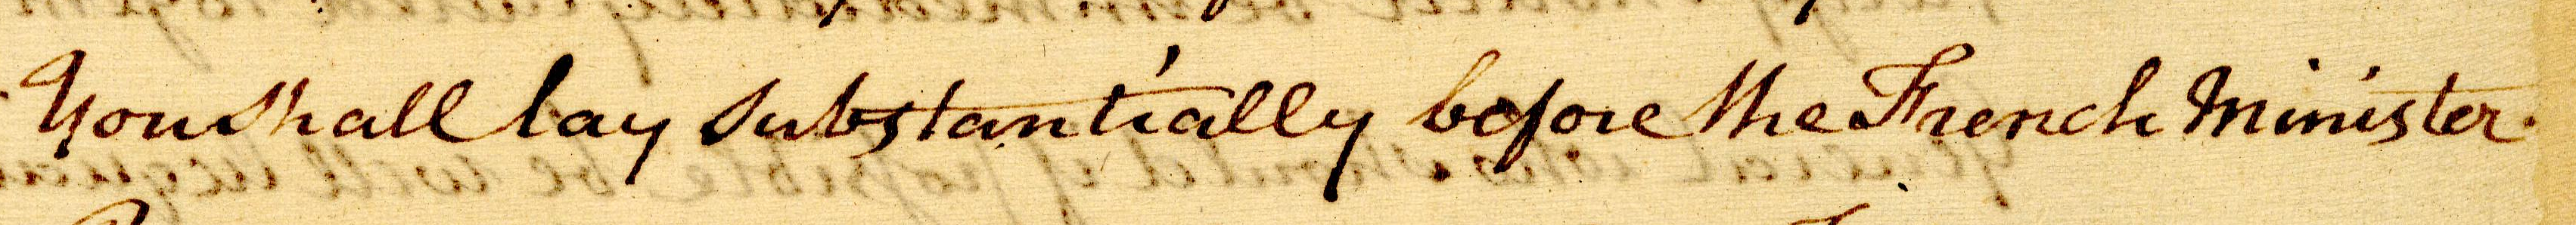You shall lay substantially before the French Minister.
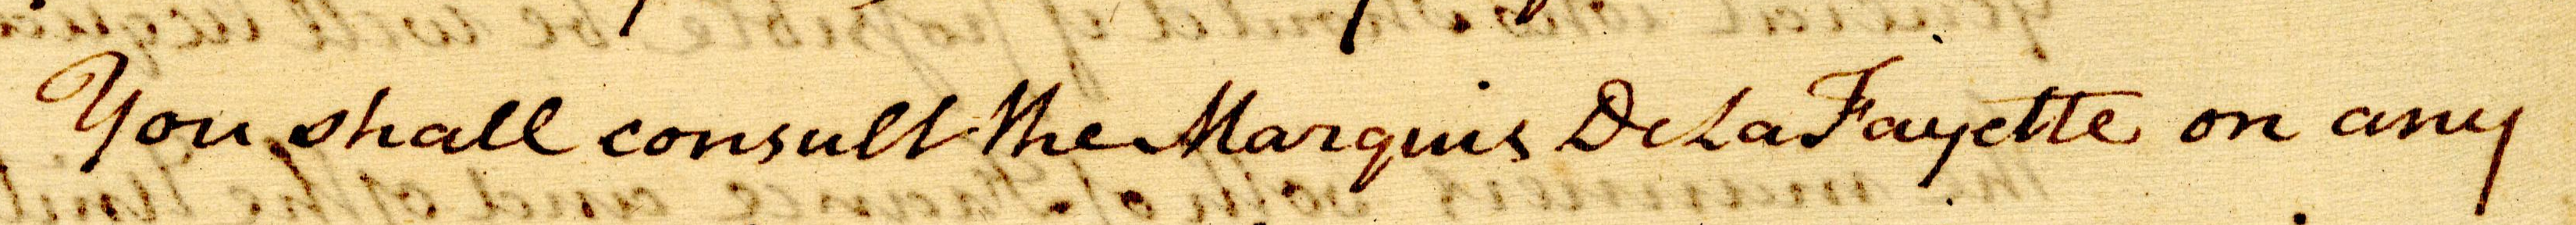You shall consult the Marquis De La Fayette on any
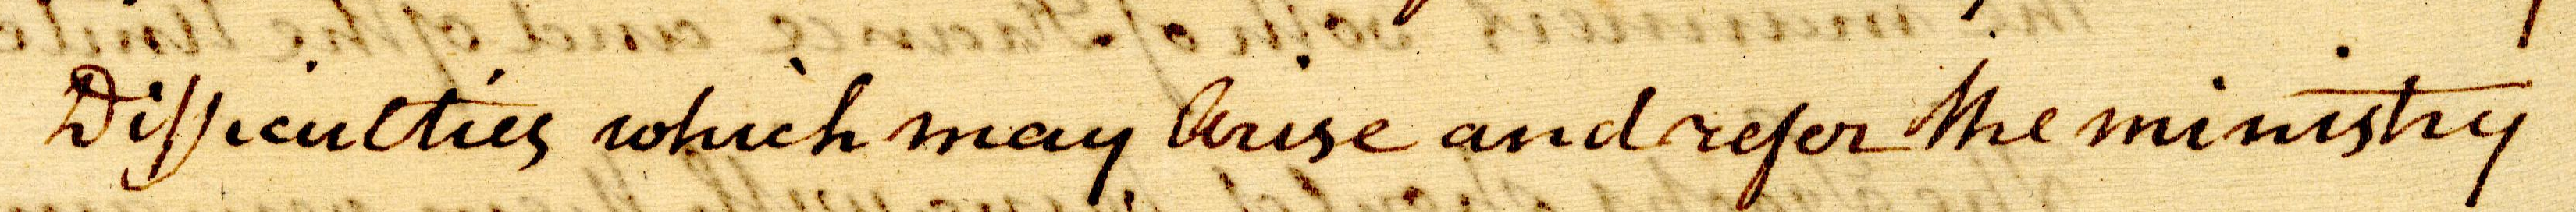Difficulties which may Arise and refer the ministry
